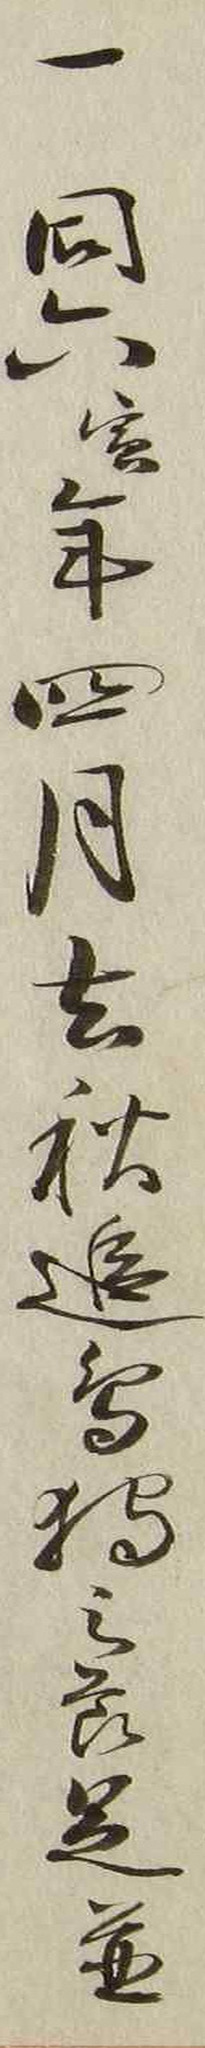一同六寅年四月去秋追鳥狩之節足並
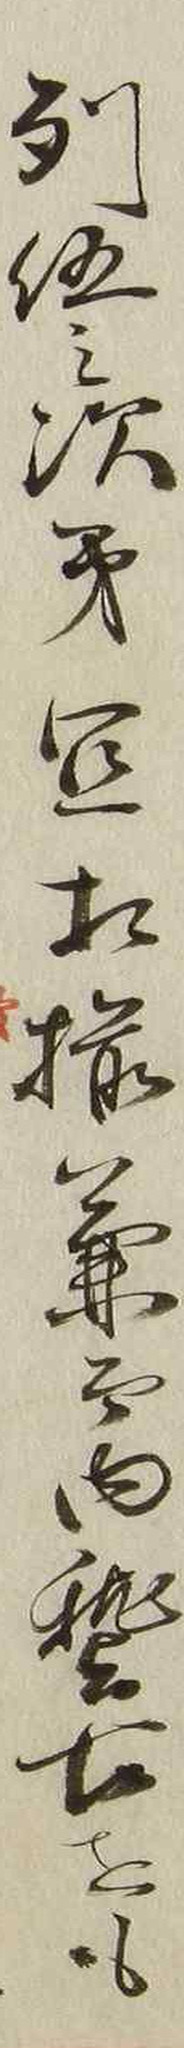列伍之次第宜相揃兼而内稽古をも
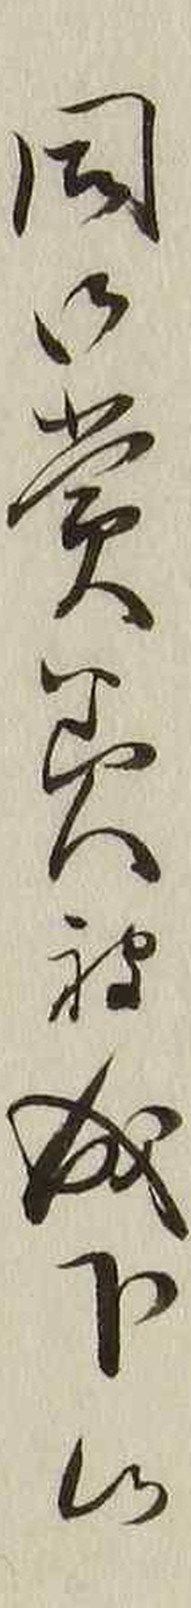同御賞美被成下候
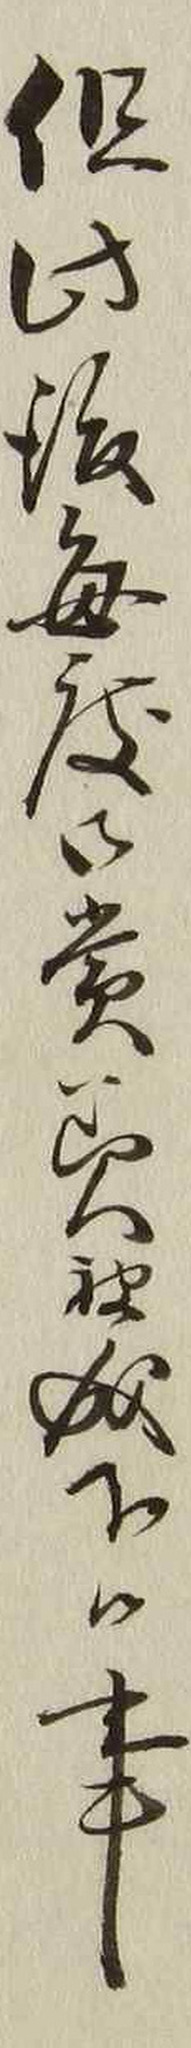但此後毎度御賞美被成下候事
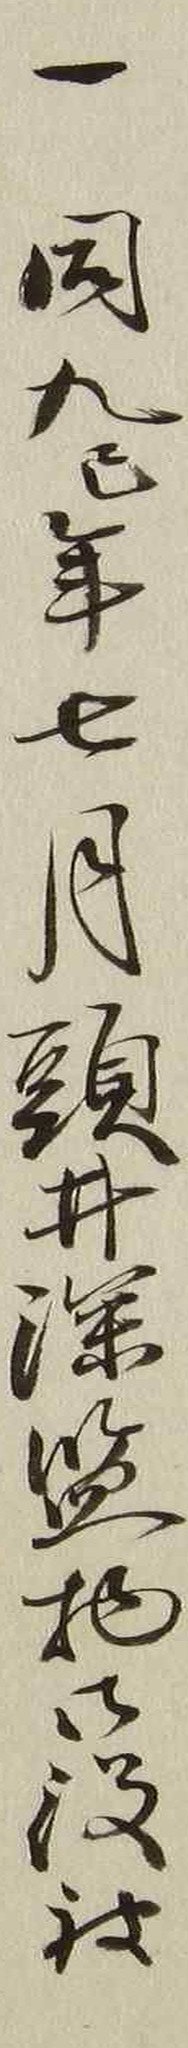一同九巳年七月頭井深監物御役被
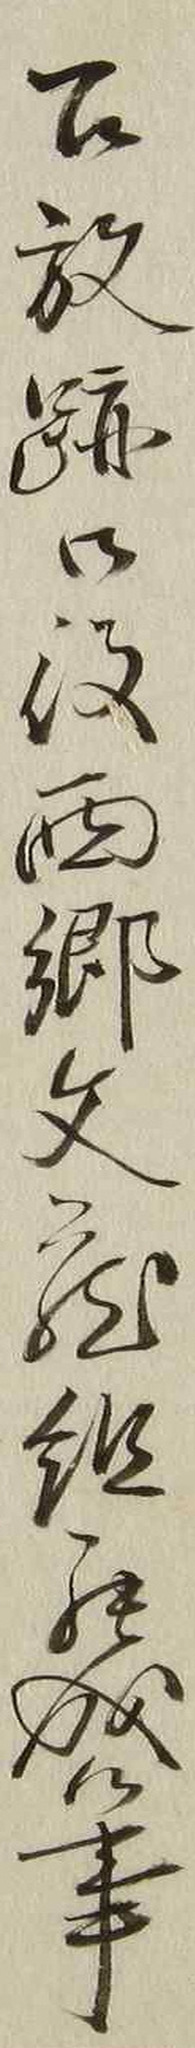召放跡御役西郷文蔵組罷成候事
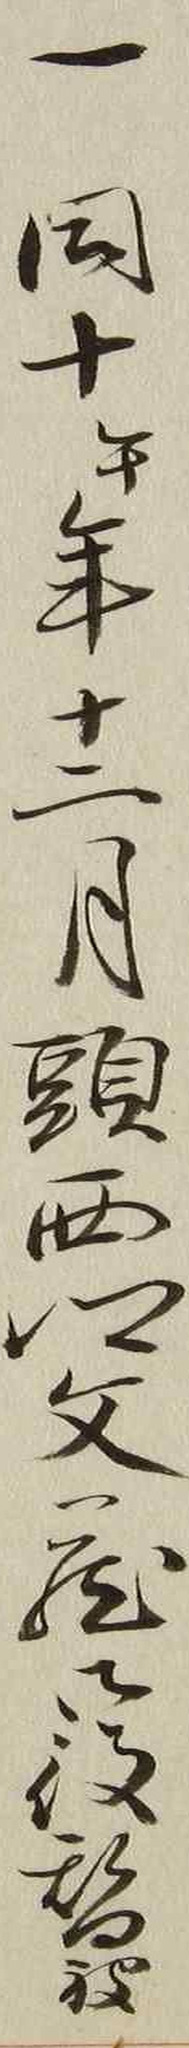一同十午年十二月頭西郷文蔵御役替被
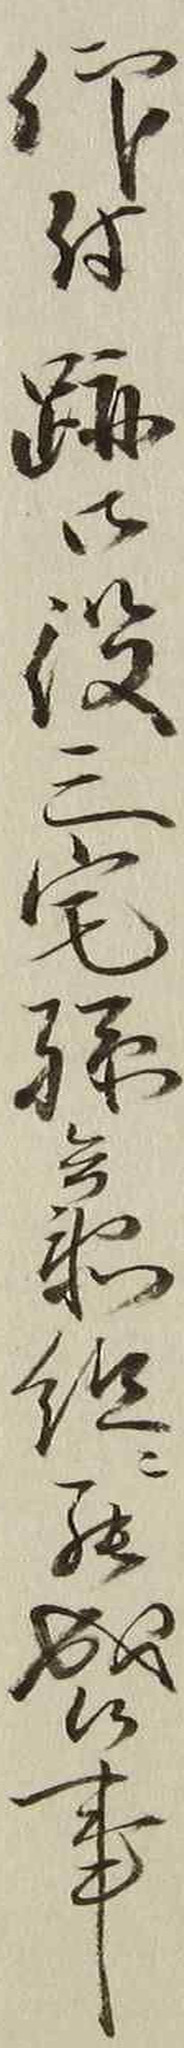仰付跡御役三宅孫兵衛組ニ罷成候事
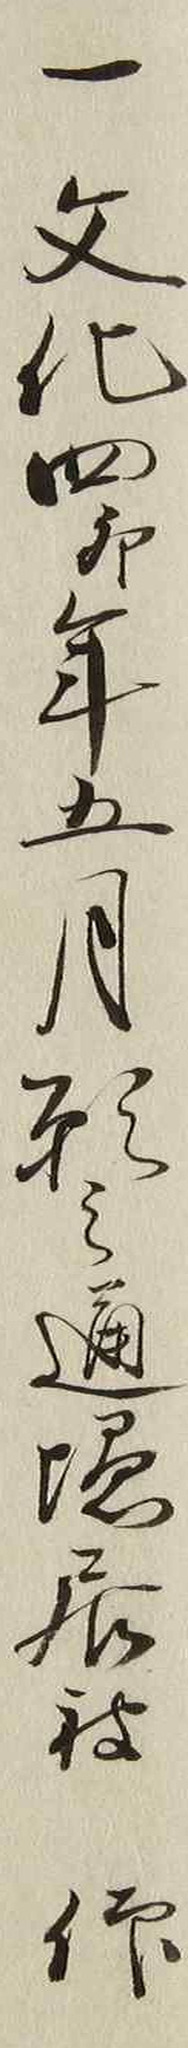一文化四卯年五月願之通隠居被仰
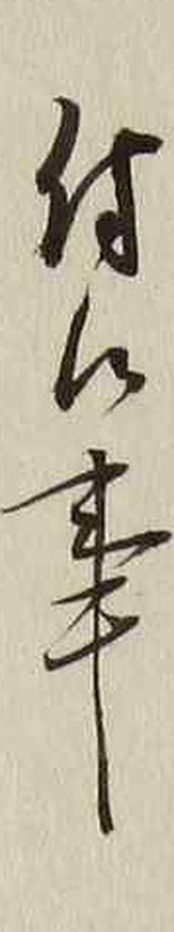付候事
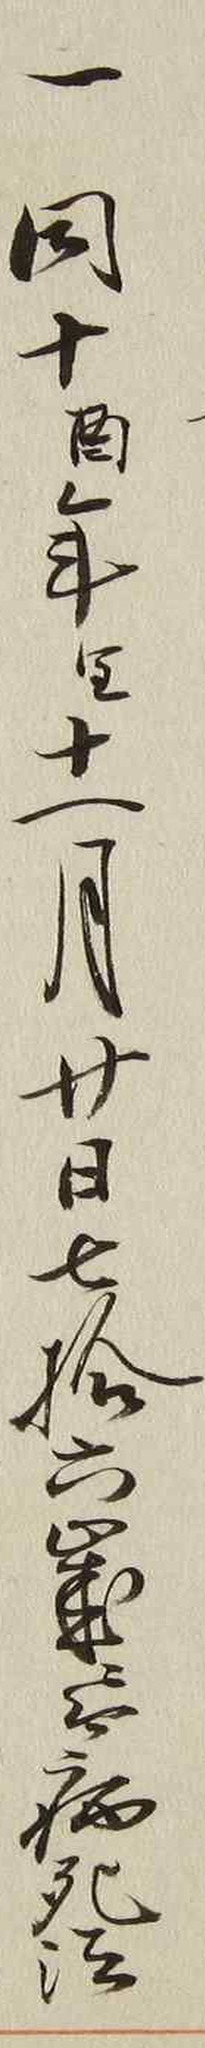一同十酉年閏十一月廿日七拾六歳ニ而病死法
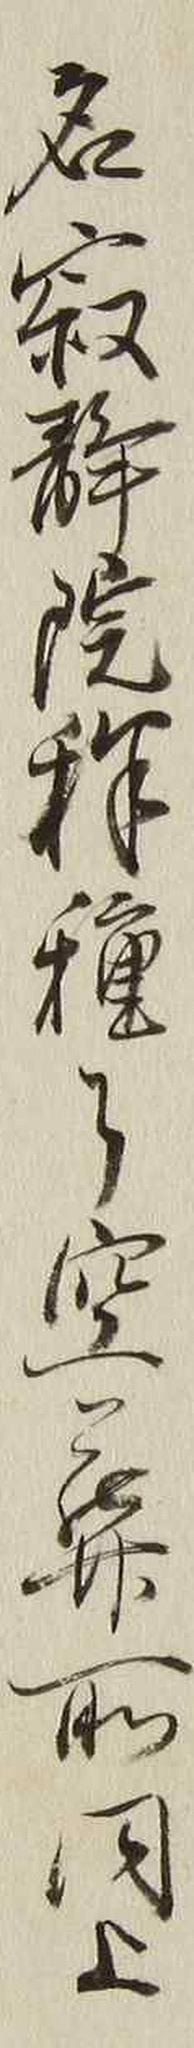名寂静院釈種了空葬所同上
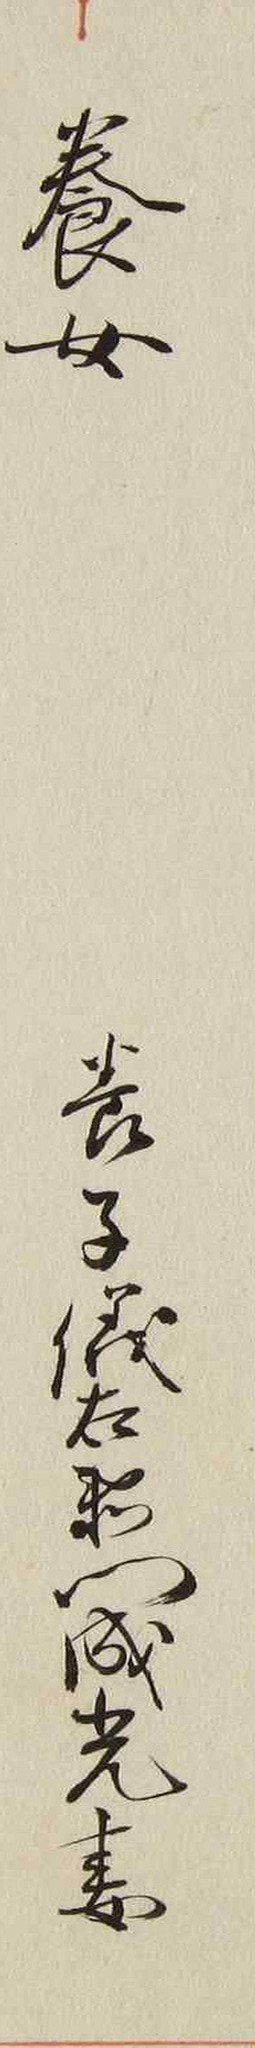養女養子儀右衛門成光妻
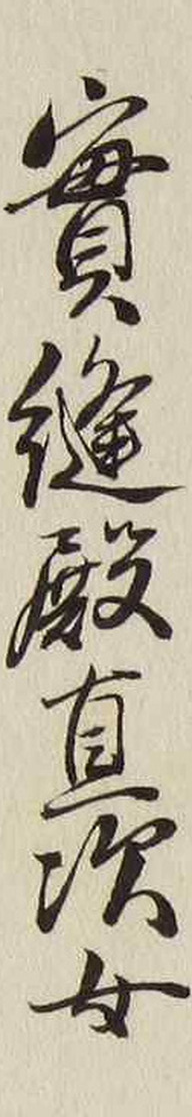実縫殿直次女
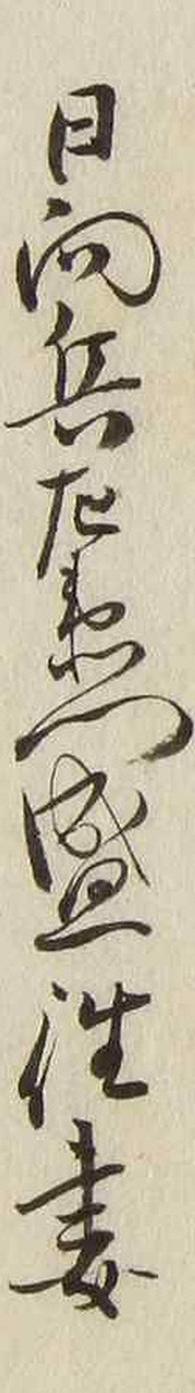女日向兵左衛門盛往妻

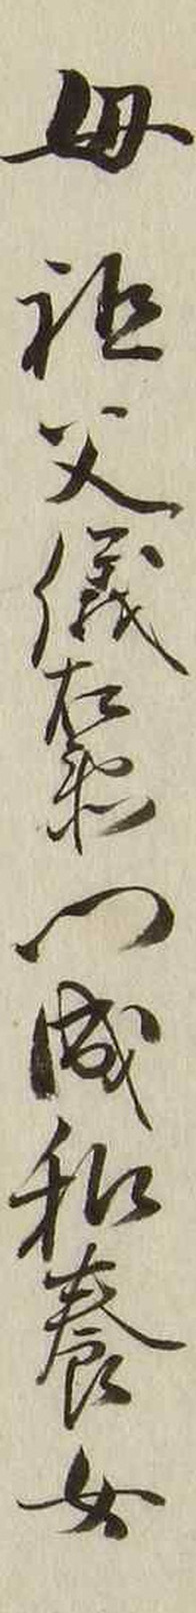母祖父儀右衛門成和養女
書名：諸士系譜　巻之163　な之部5
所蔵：会津若松市立会津図書館
